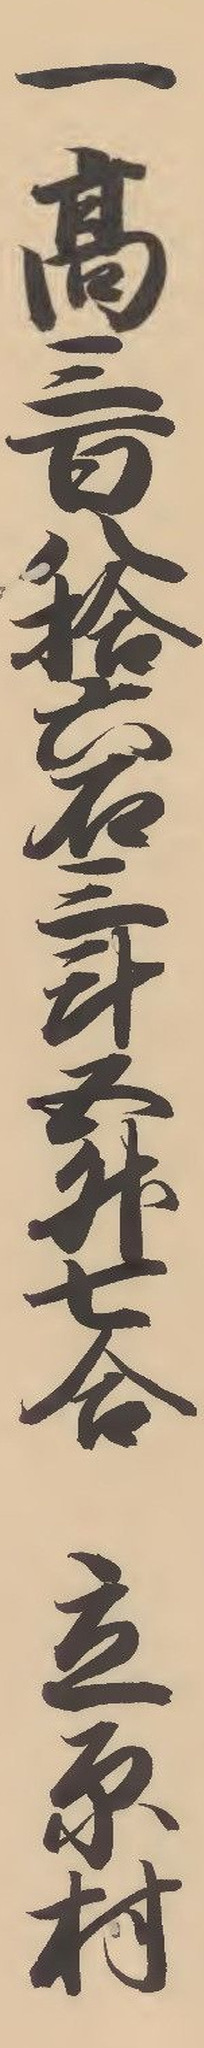一高三百八拾六石三斗五升七合立原村
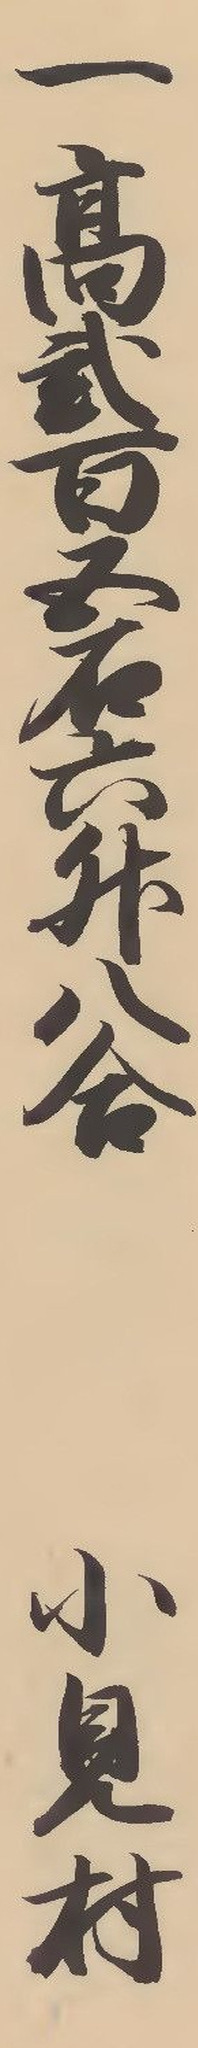一高弐百五石六升八合小見村
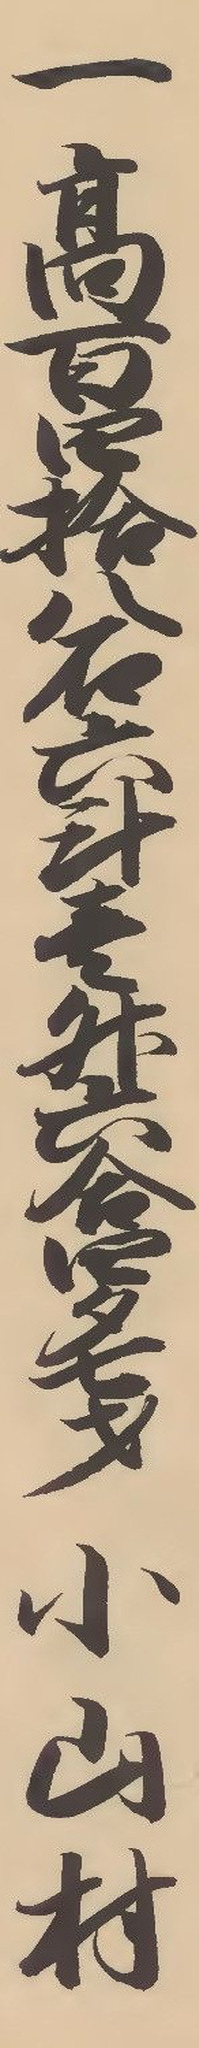一高百四拾八石六斗壱升六合四勺七才小山村
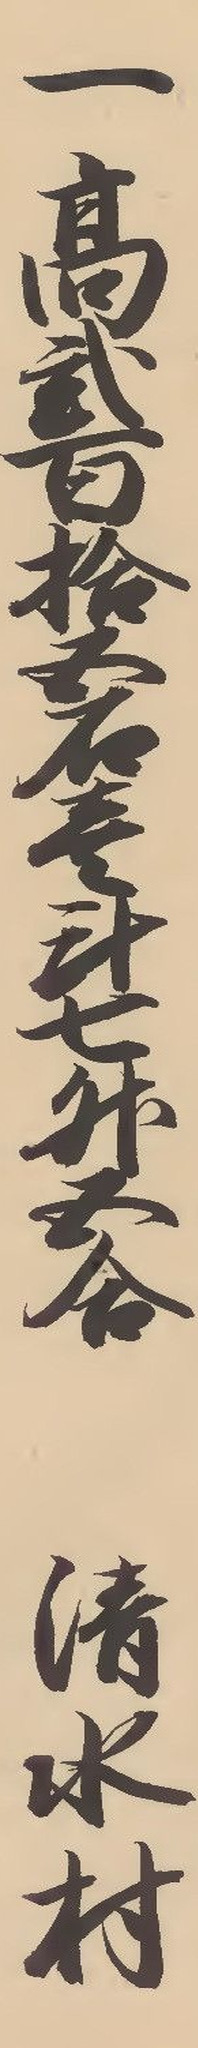一高弐百拾五石壱斗七升五合清水村
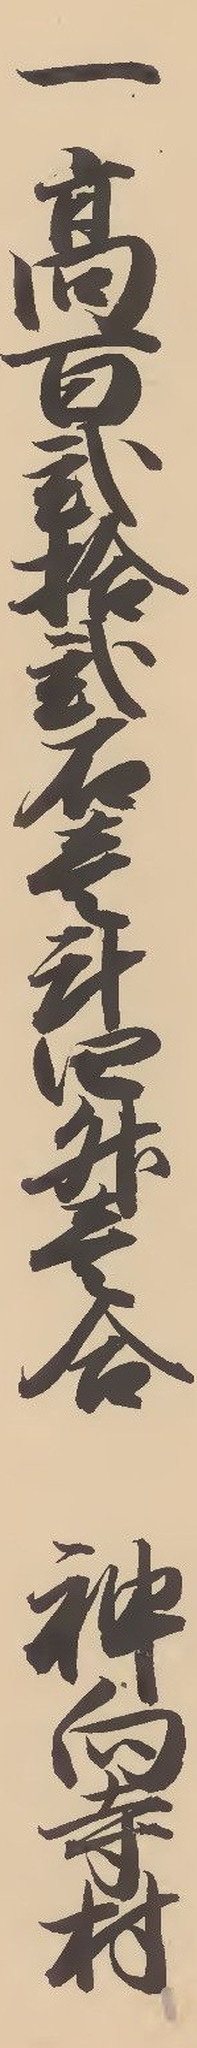一高百弐拾弐石壱斗四升壱合神向寺村
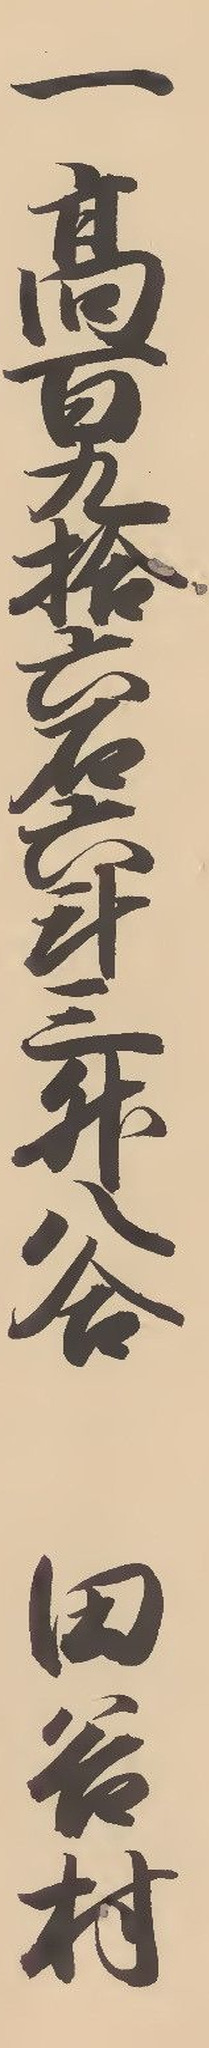一高百九拾六石六斗三升八合田谷村

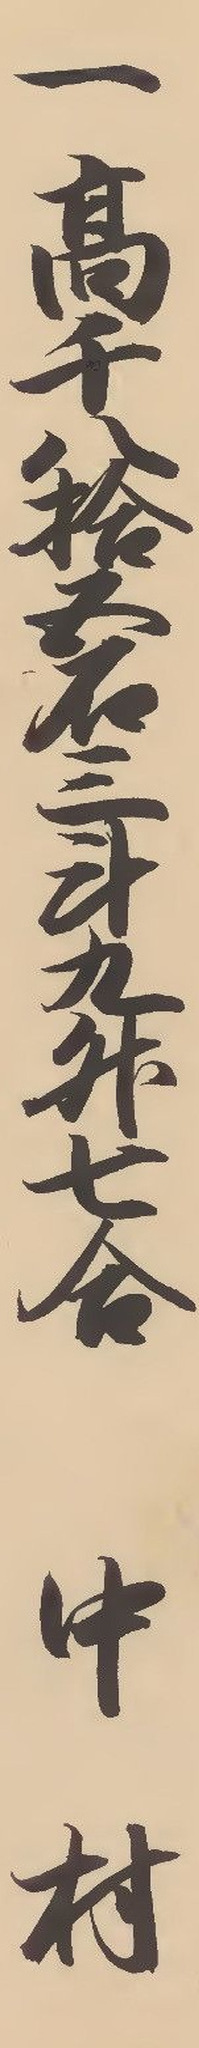一高千八拾五名三斗九升七合中村
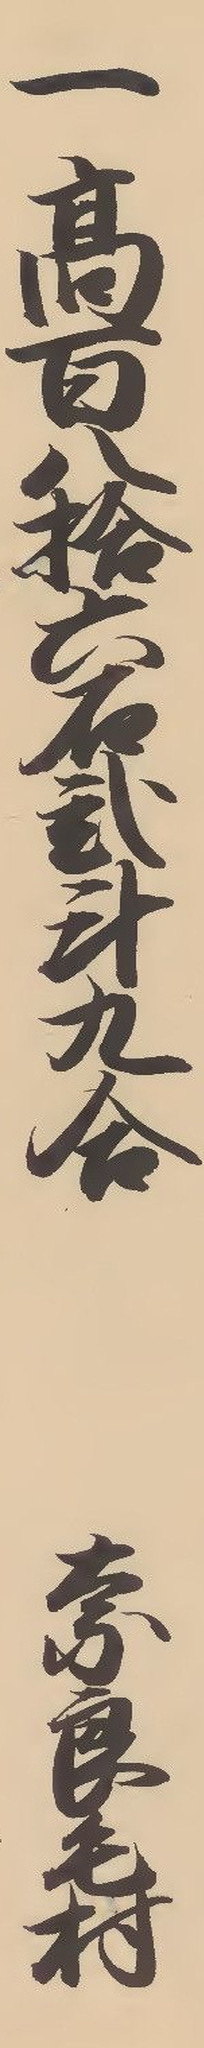一高百八拾六石弐斗九合奈良毛村
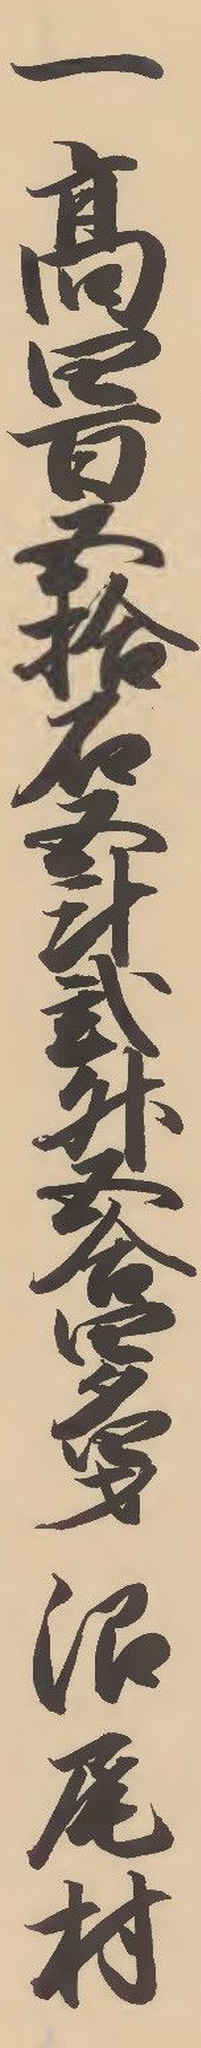一高四百五拾石五斗弐升五合四勺四才沼尾村
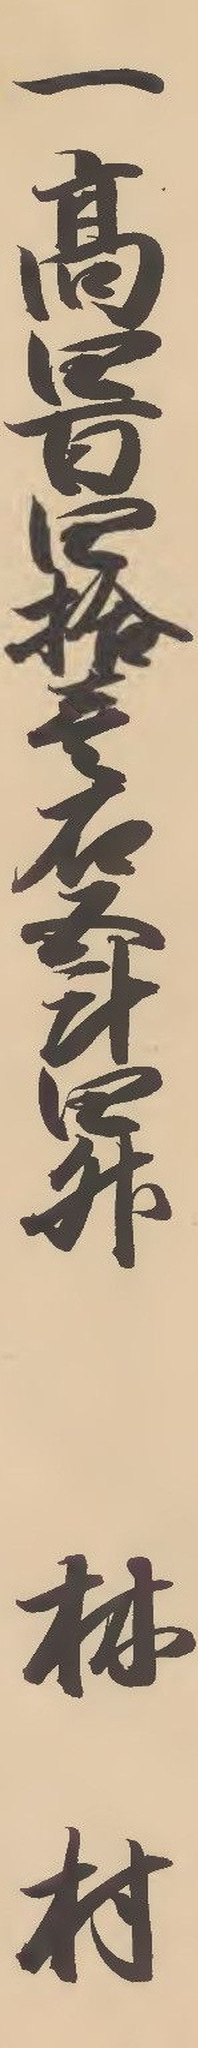一高四百四拾壱石五斗四升林村
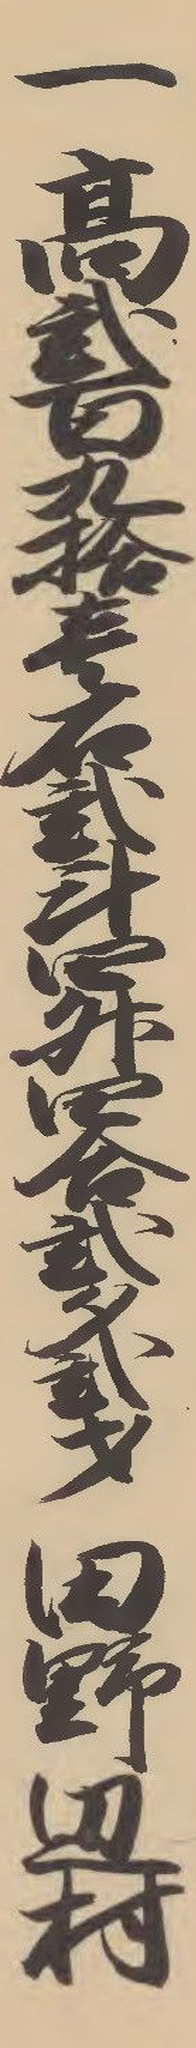一高弐百九拾壱石弐斗四升四合弐勺弐才田野辺村
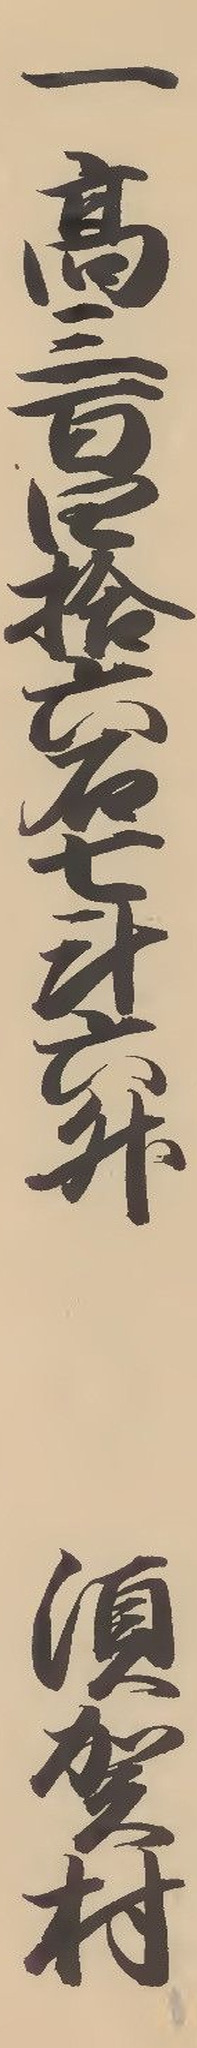一高三百四拾六石七斗六升須賀村
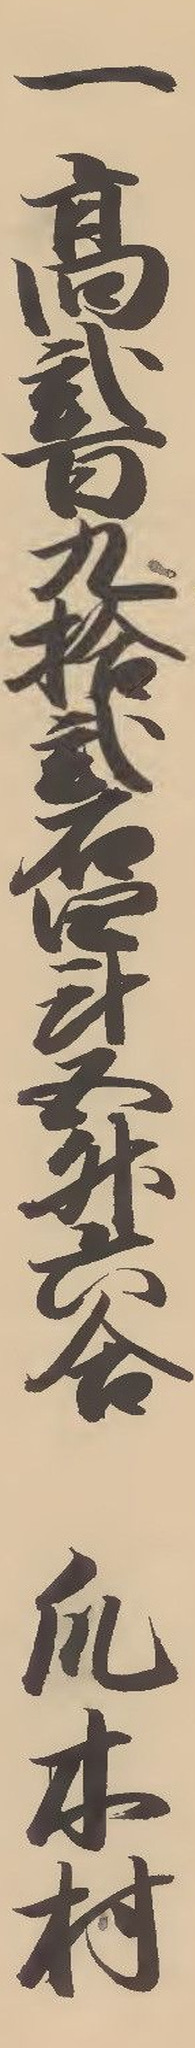一高弐百九拾弐石四斗五升六合爪木村
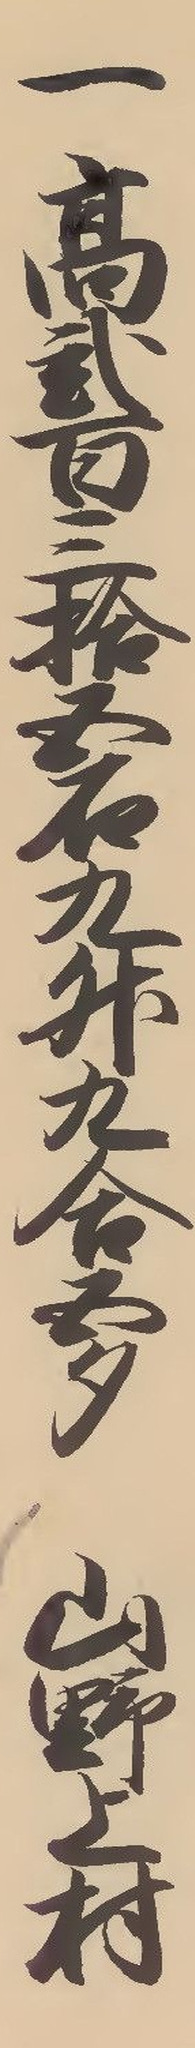一高弐百三拾五石九升九合五勺山野上村

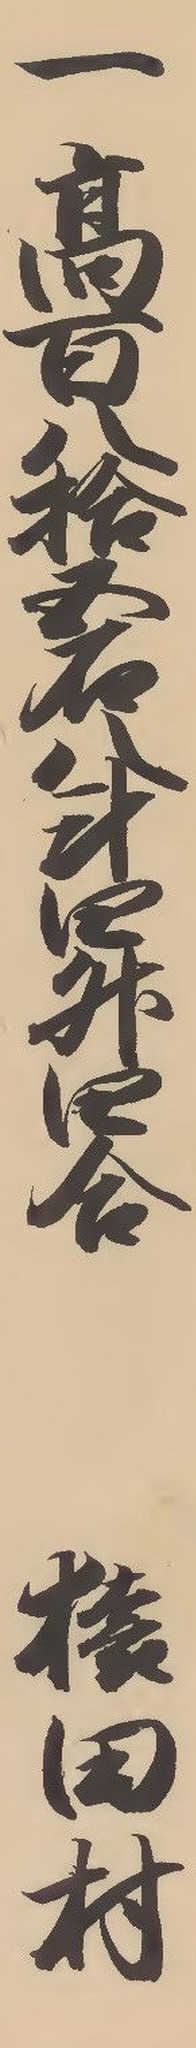一高百八拾五石八斗四升四合猿田村
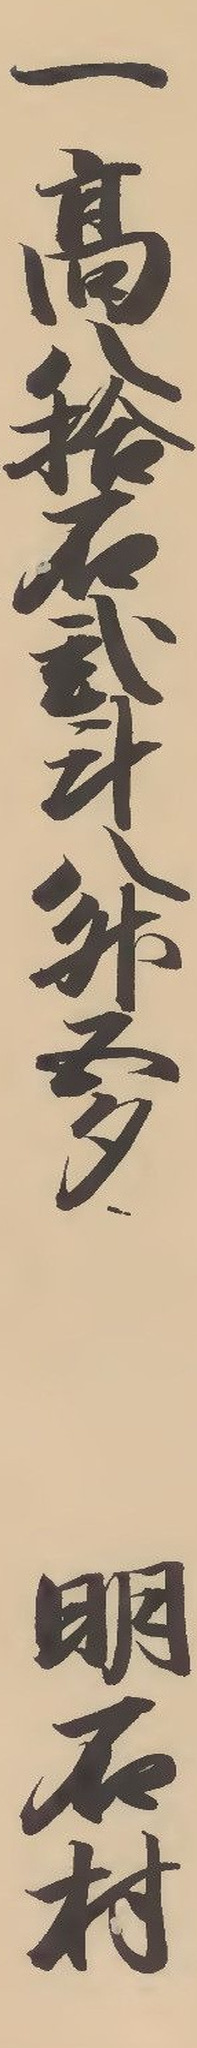一高八拾石弐斗八升五勺明石村
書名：常陸国郷帳
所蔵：国立公文書館 National Archives of Japan
